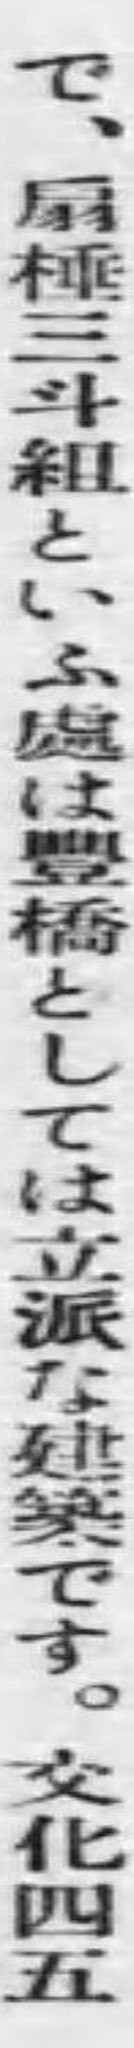で、扇棰三斗組といふ処は豊橋としては立派な建築です。文化四五
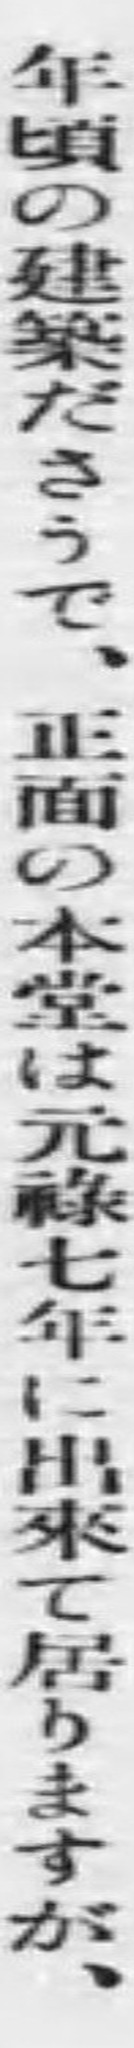年頃の建築ださうで、正面の本堂は元禄七年に出来て居りますが、
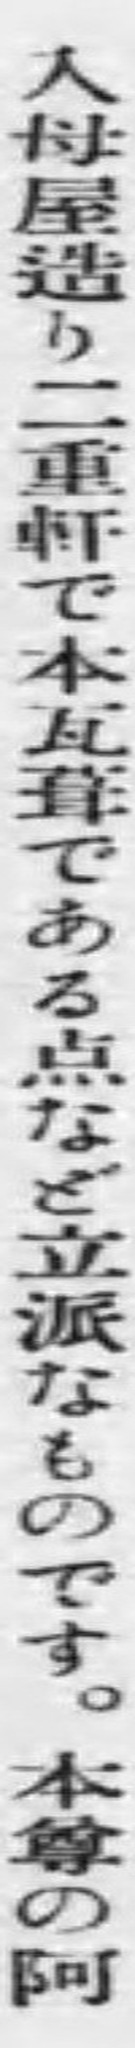入母屋造り二重軒で本瓦葺である点など立派なものです。本尊の阿
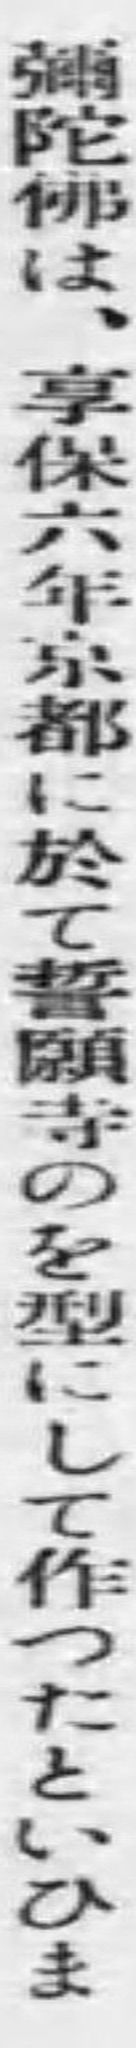弥陀仏は、享保六年京都に於て誓願寺のを型にして作つたといひま
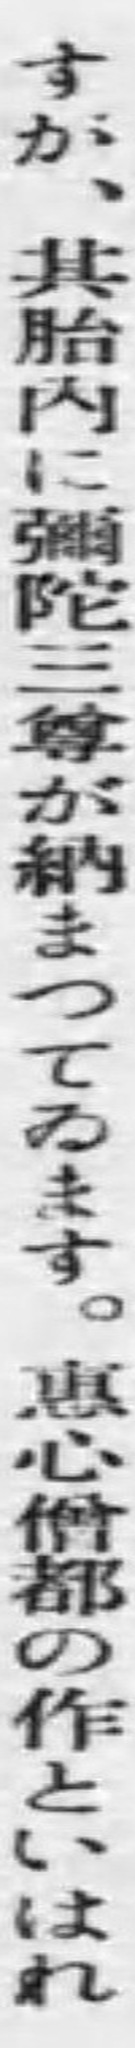すが、其胎内に弥陀三尊が納まつてゐます。恵心僧都の作といはれ
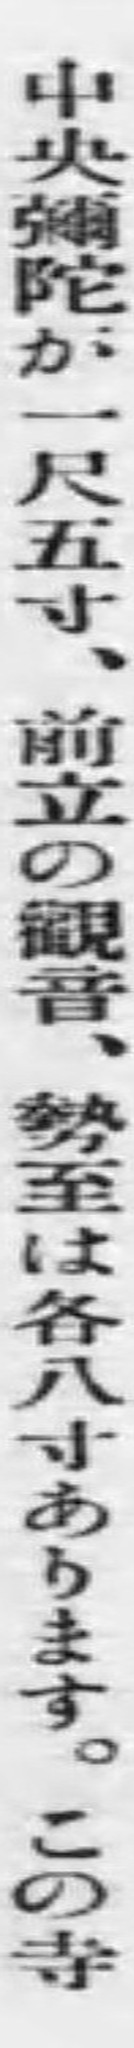中央弥陀が一尺五寸、前立の観音、勢至は各八寸あります。この寺
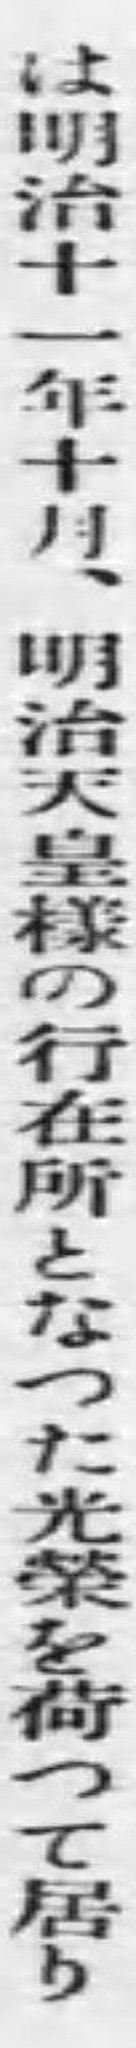は明治十一年十月、明治天皇様の行在所となつた光栄を荷つて居り
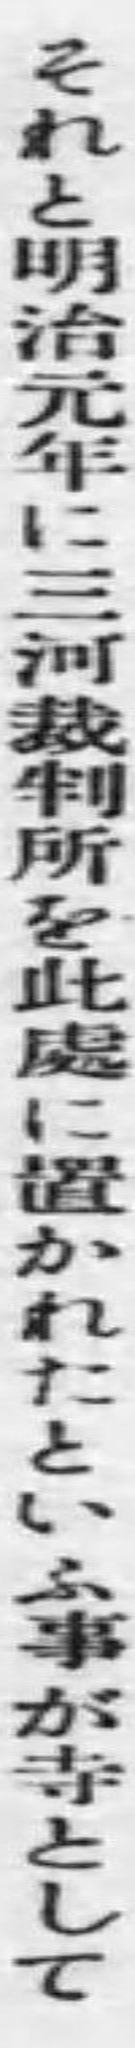それと明治元年に三河裁判所を此処に置かれたといふ事が寺として
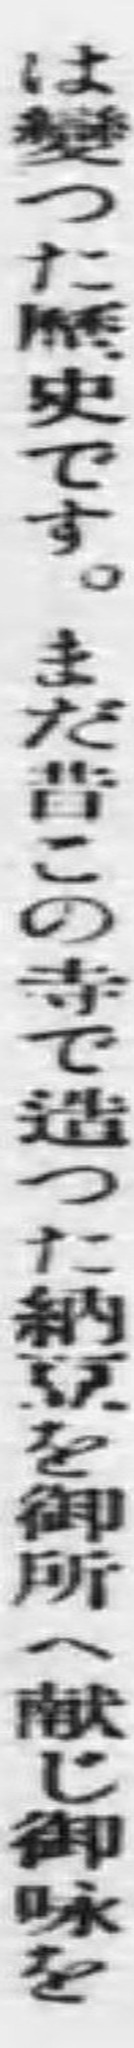は変つた歴史です。まだ昔この寺で造つた納豆を御所へ献じ御咏を
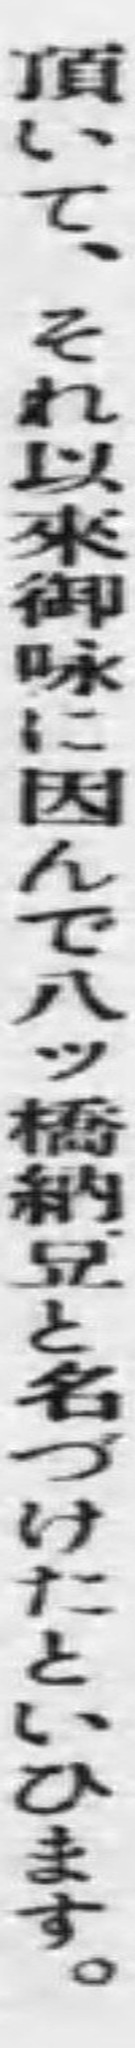頂いて、それ以来御咏に因んで八ッ橋納豆と名づけたといひます。
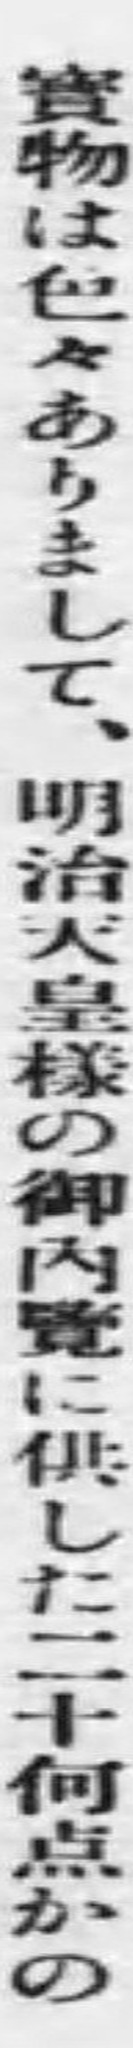宝物は色々ありまして、明治天皇様の御内覧に供した二十何点かの

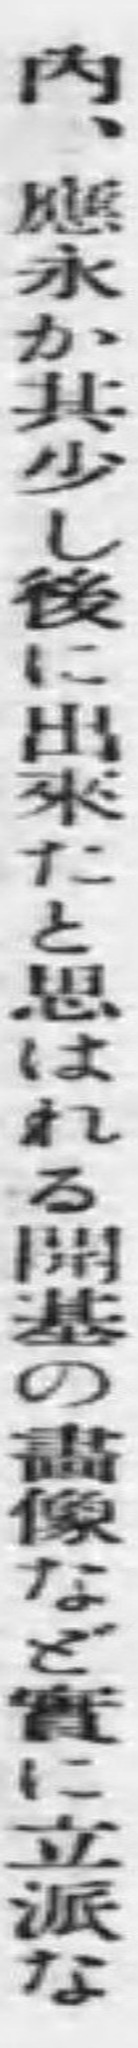内、応永か其少し後に出来たと思はれる開基の画像など実に立派な
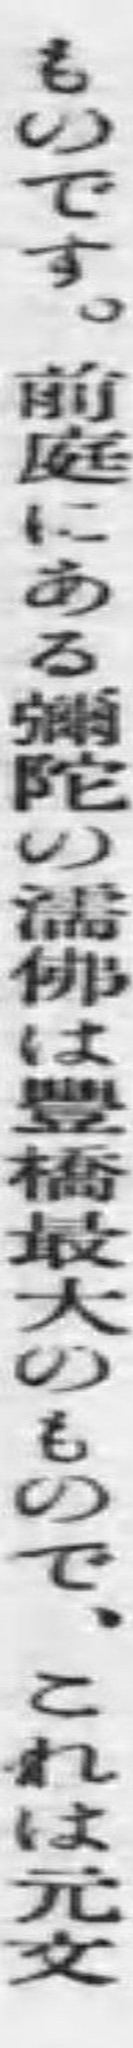ものです。前庭にある弥陀の濡仏は豊橋最大のもので、これは元文
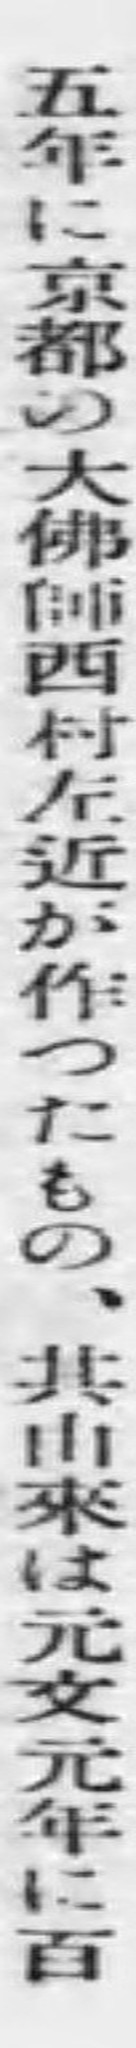五年に京都の大仏師西村左近が作つたもの、其由来は元文元年に百
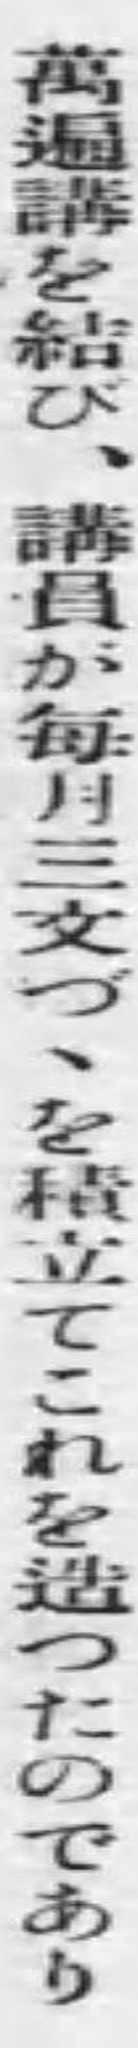万遍講を結び、講員が毎月三文づゝを積立てこれを造つたのであり
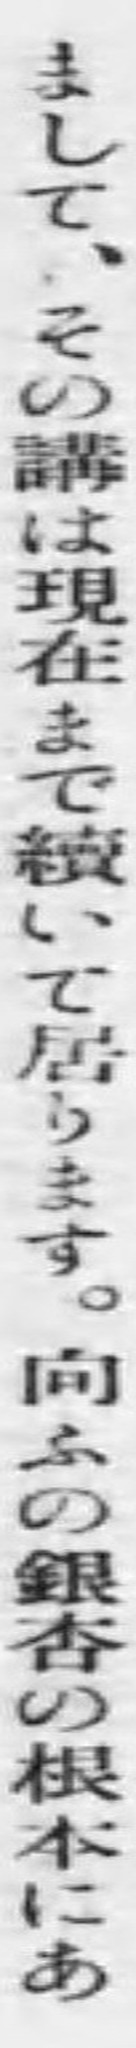まして、その講は現在まで続いて居ります。向ふの銀杏の根本にあ
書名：東三河道中記 : 豊橋市及其附近案内
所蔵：国立国会図書館 National Diet Library, JAPAN
